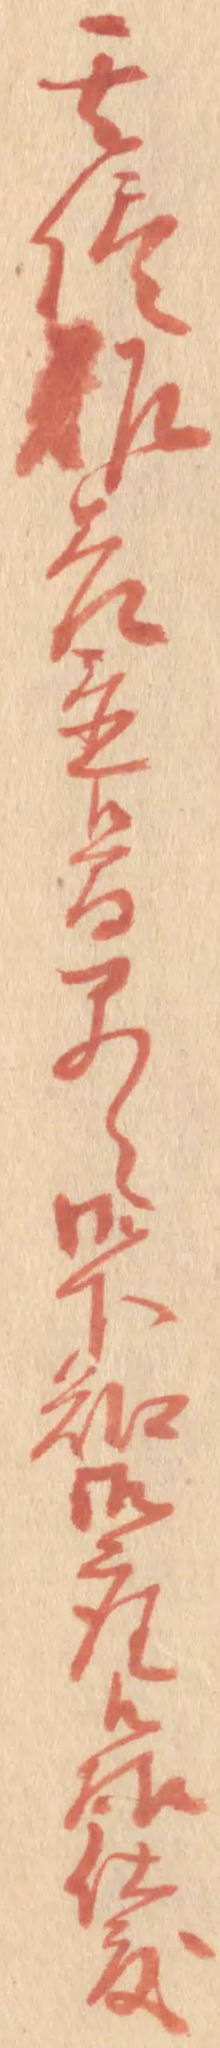其侭難差置候間早々御下知御座候様仕度
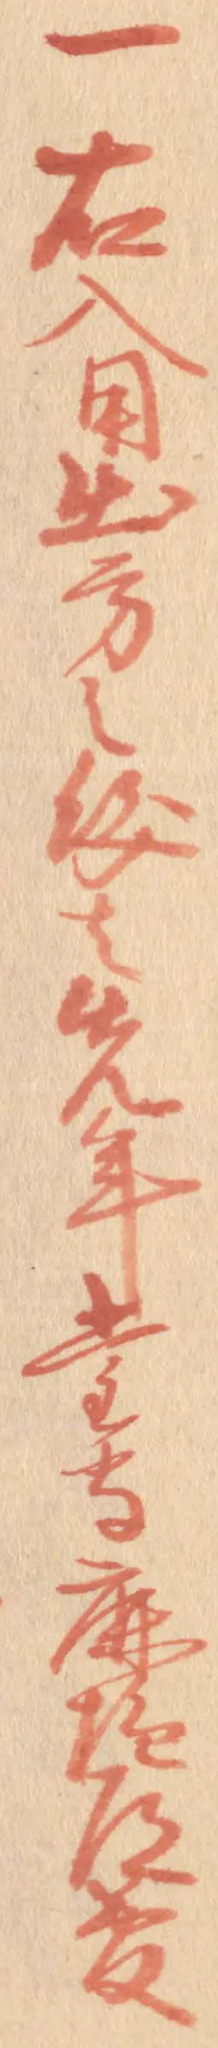一右入用出方之儀は先年堂守鹿塩道菅
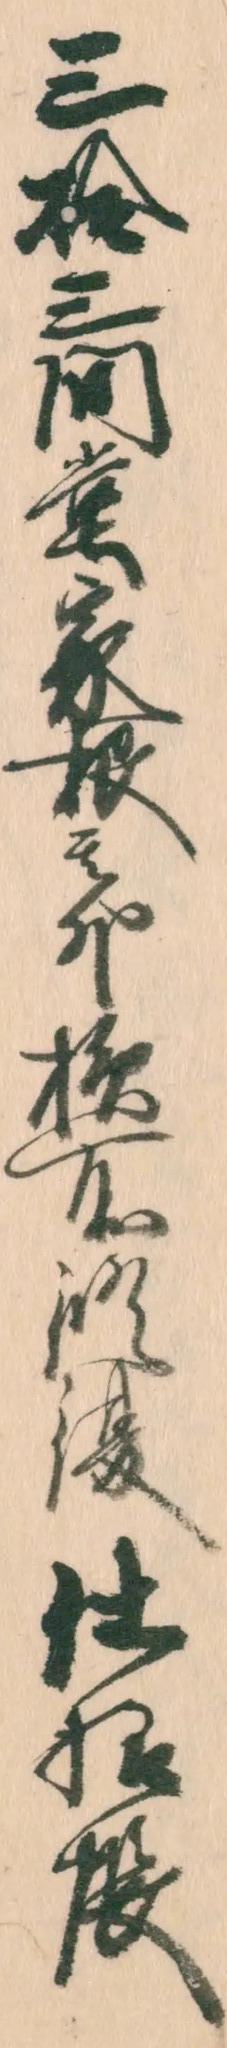三拾三間堂屋根其外損所修復仕様帳

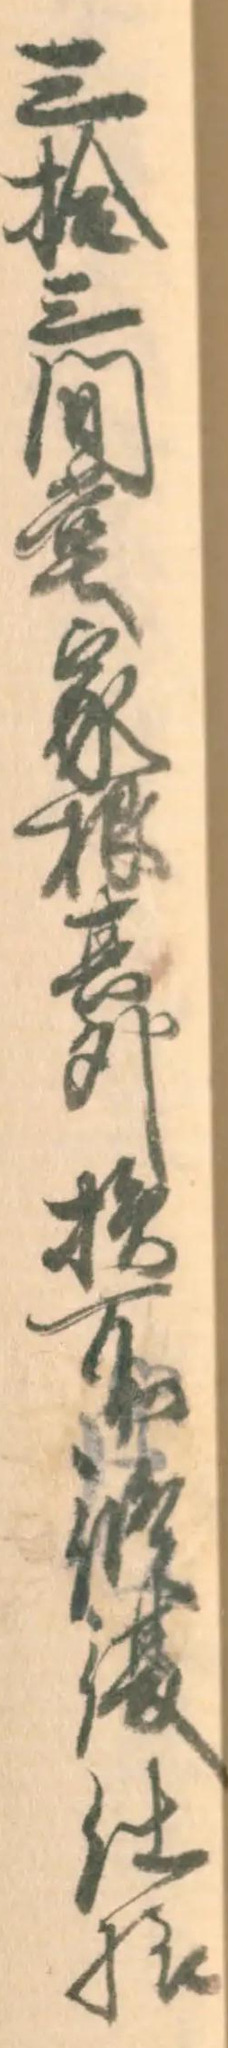三拾三間堂家根其外損所修復仕様
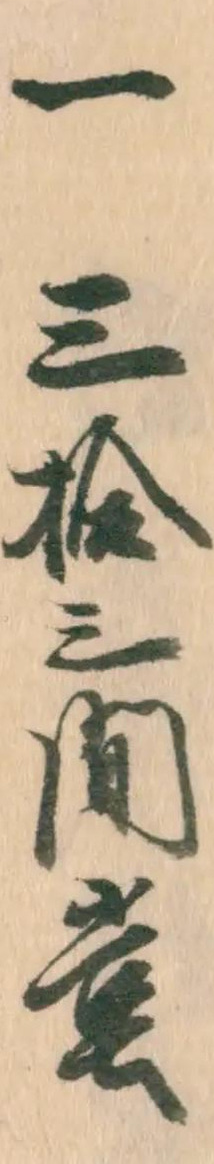一三拾三間堂
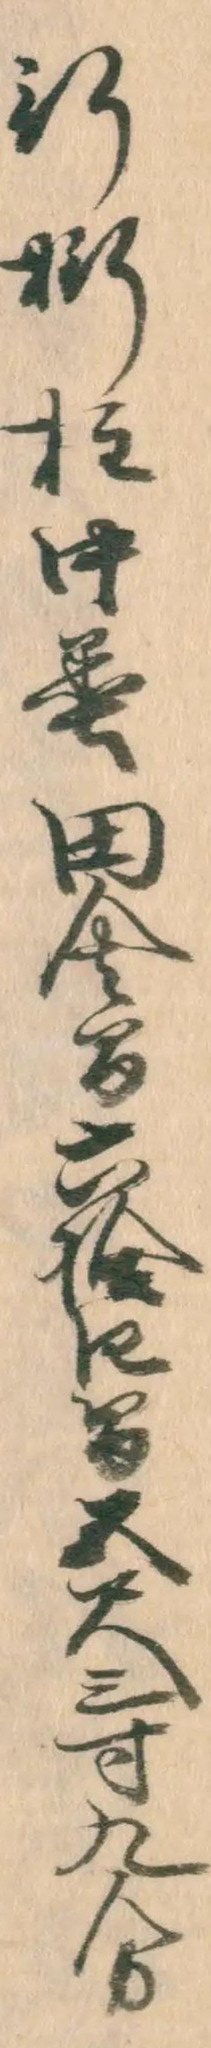行桁柱中墨田舎間六拾四間五尺三寸九分
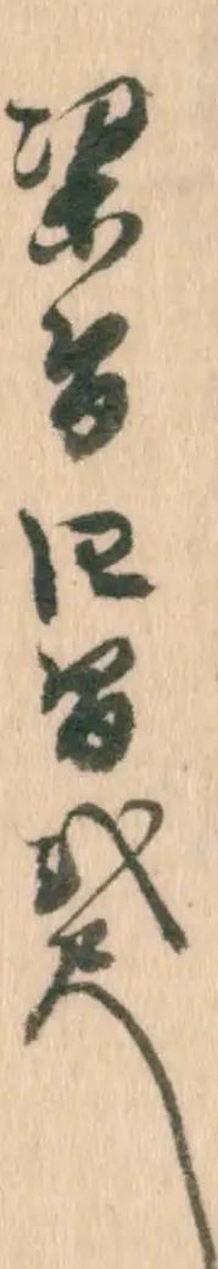梁間四間弐尺
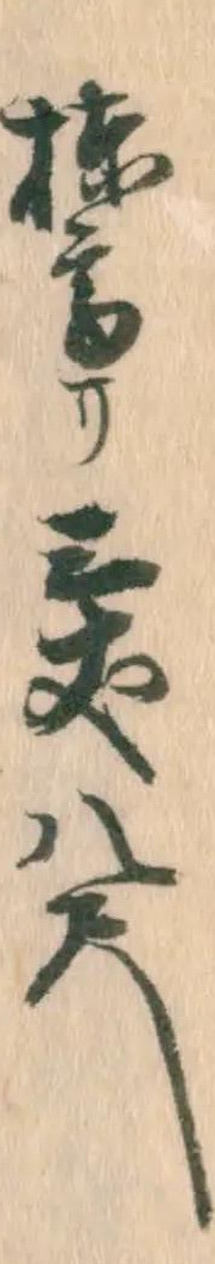棟高さ三丈八尺
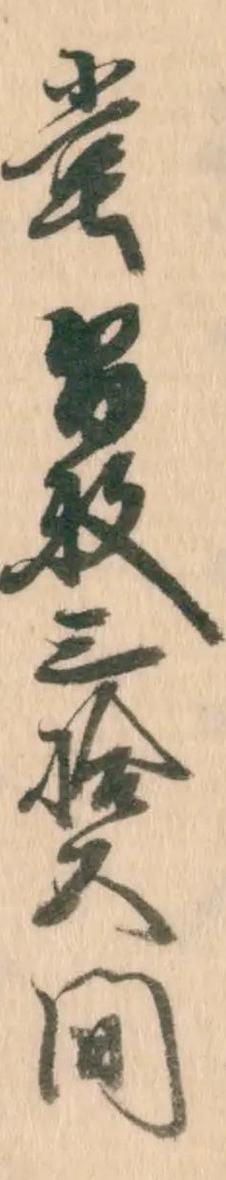堂間数三拾五間
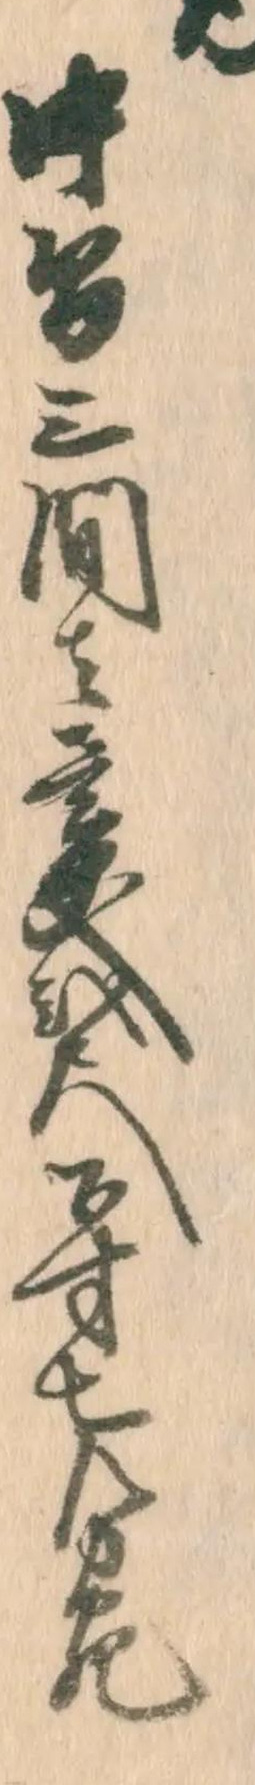中間三間は壱丈弐尺五寸七分宛
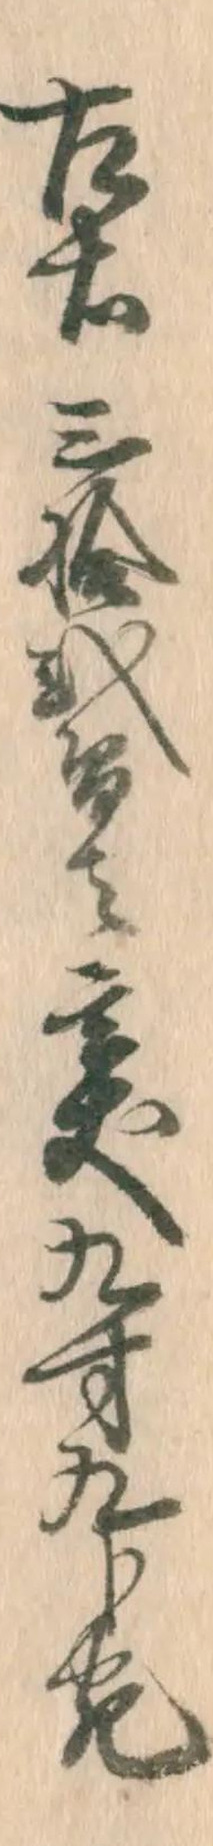左右三拾弐間は壱丈九寸九分宛

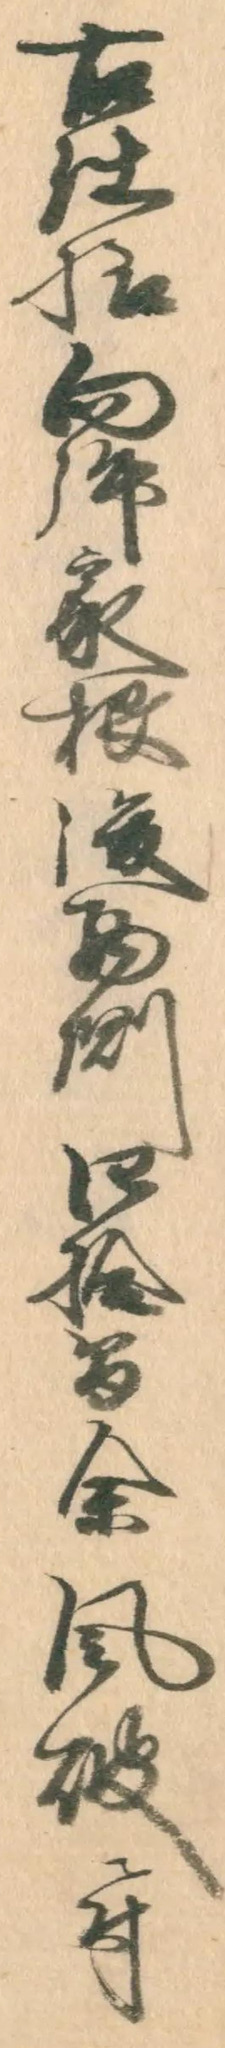右仕様向拝家根後西側四拾間余風破に付
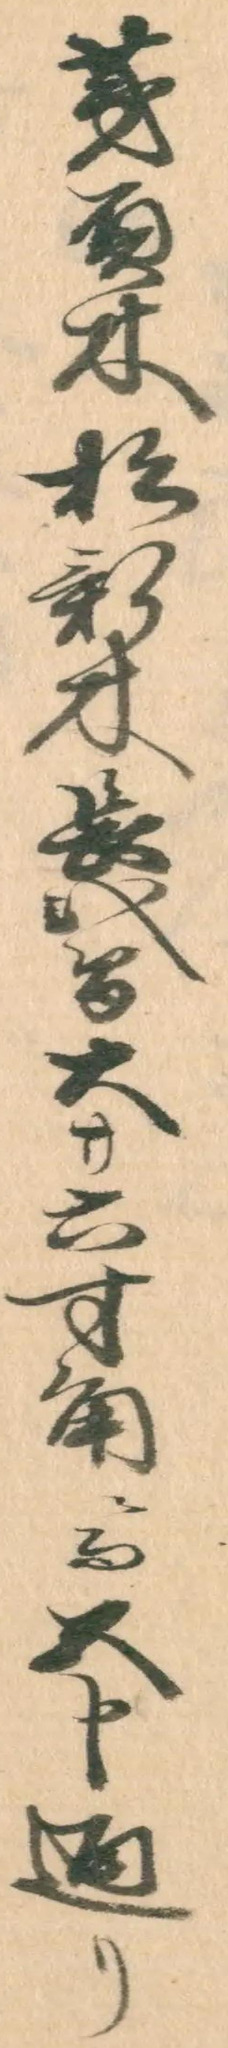茅負木松新木長弐間大さ六寸角に而五分通り
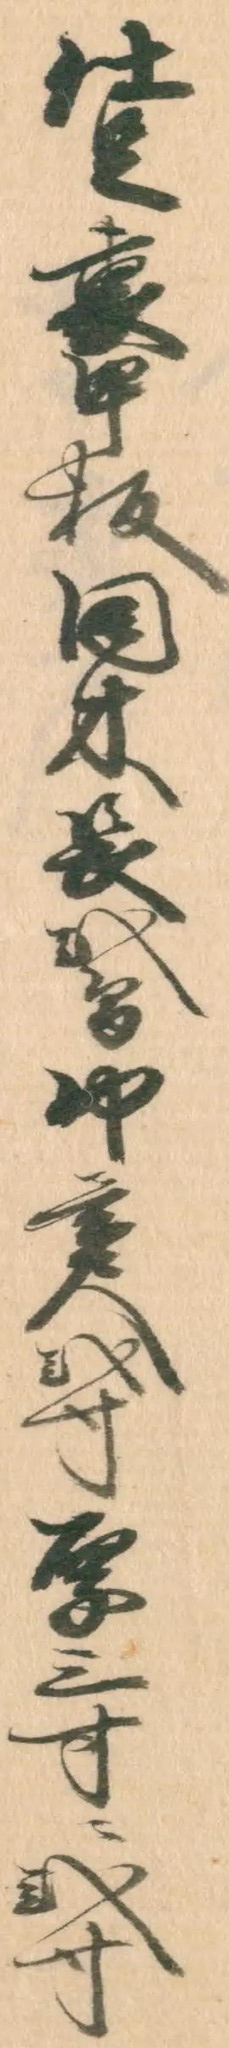仕足裏甲板用木長弐間巾壱尺弐寸厚三寸に弐寸
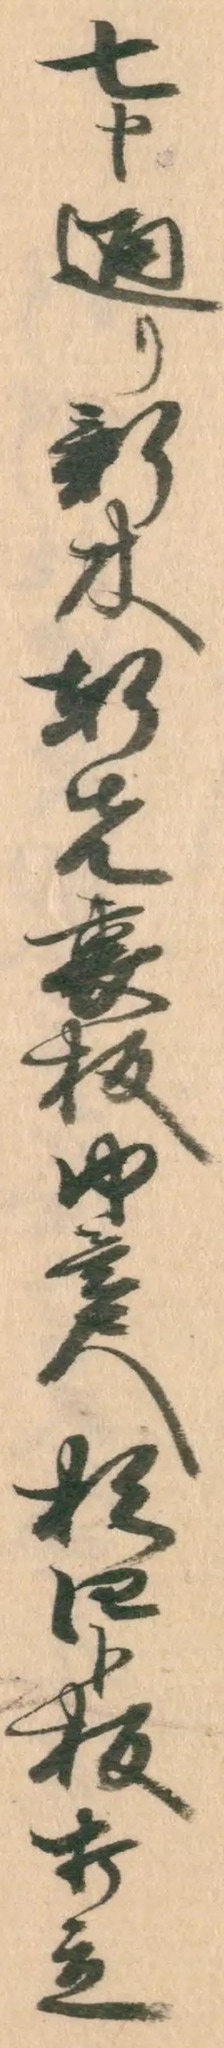七分通り新木軒先裏板巾壱尺松四分板打立
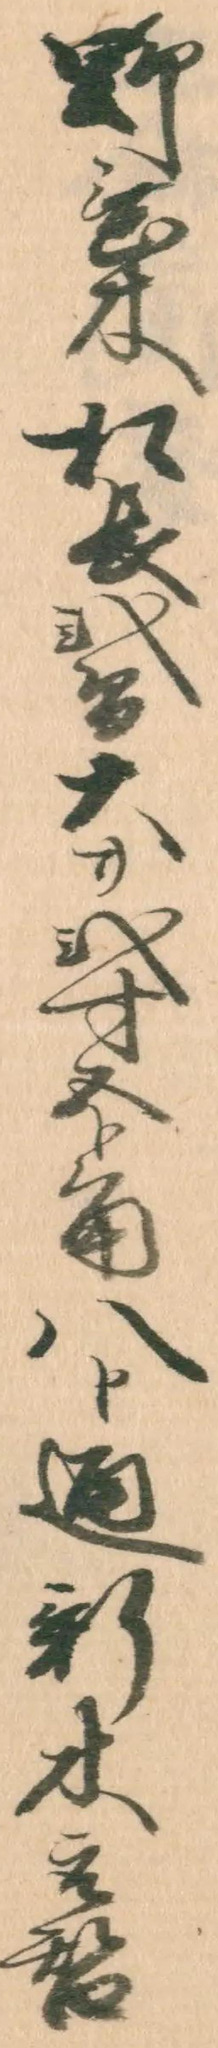野垂木松長弐間大さ弐寸五分角八分通新木取替
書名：三十三間堂. [1]
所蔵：国立国会図書館 National Diet Library, JAPAN
